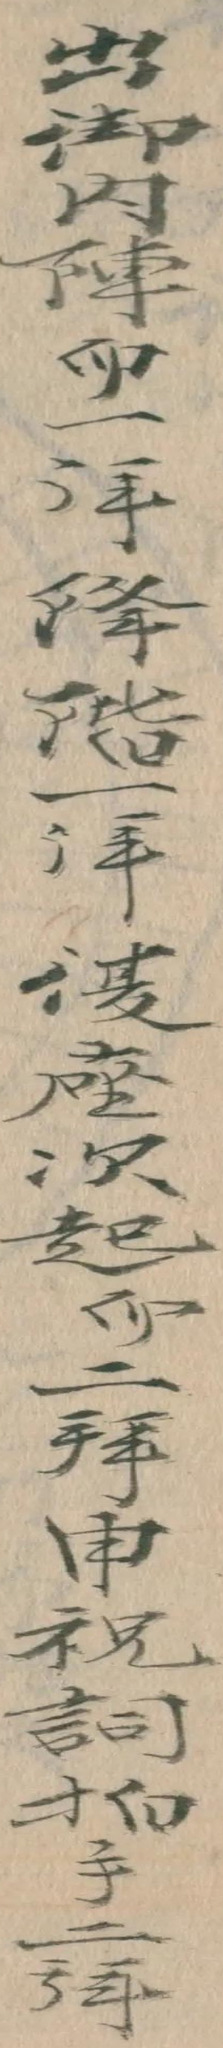出御内陣而一拝降階一拝復座次起而二拝申祝詞拍手二拝
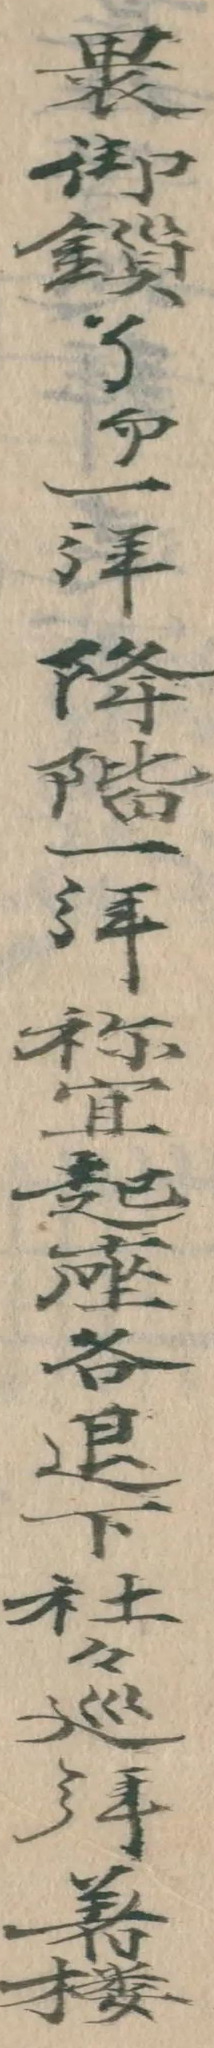裹御鎖了而一拝降階一拝祢宜起座各退下社々巡拝着楼
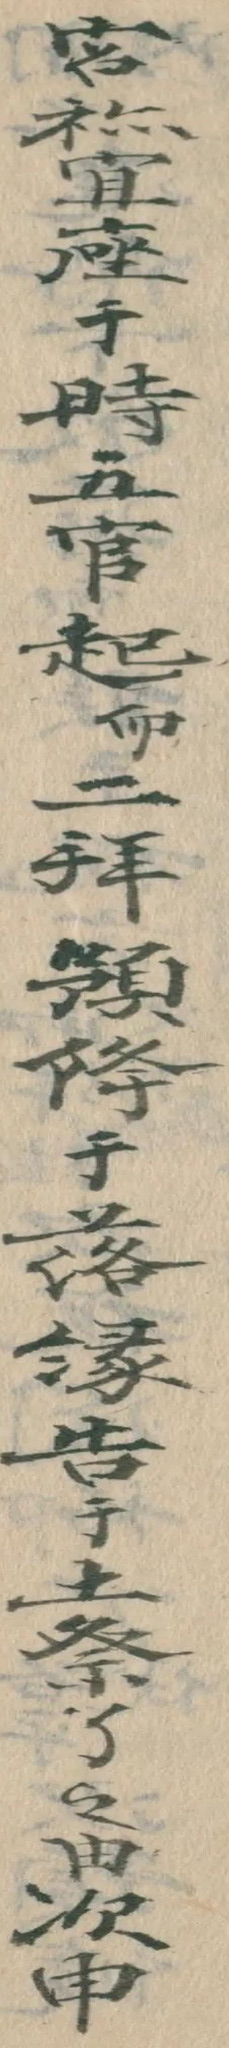宮祢宜座于時五官起而二拝預降于落縁告于土祭了之由次申
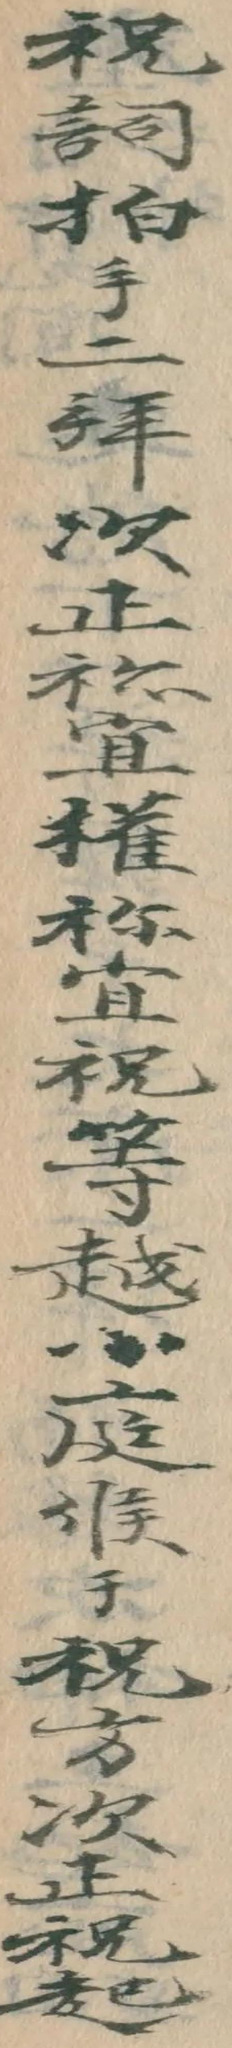祝詞拍手二拝次正祢宜権祢宜祝等越小庭候于祝方次正祝起

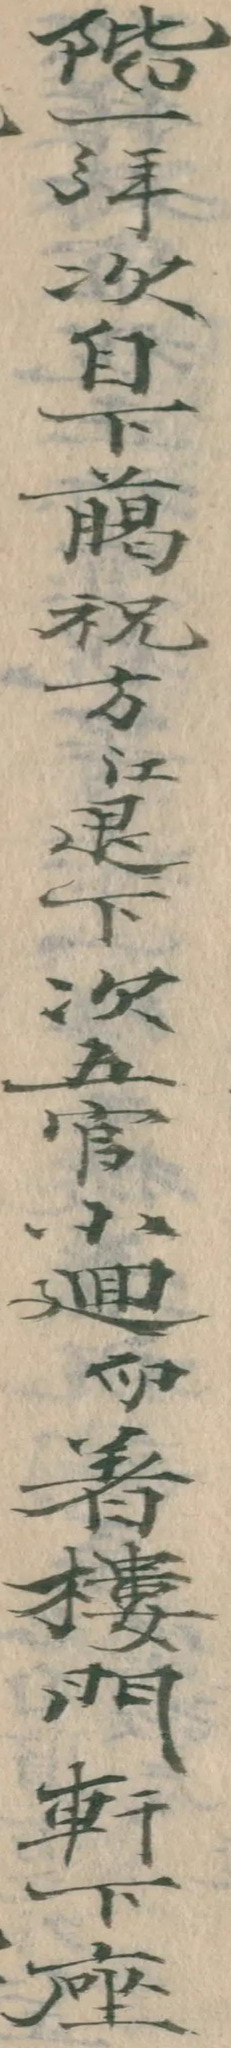階一拝次自下臈祝方江退下次五官小廻而着楼門軒下座
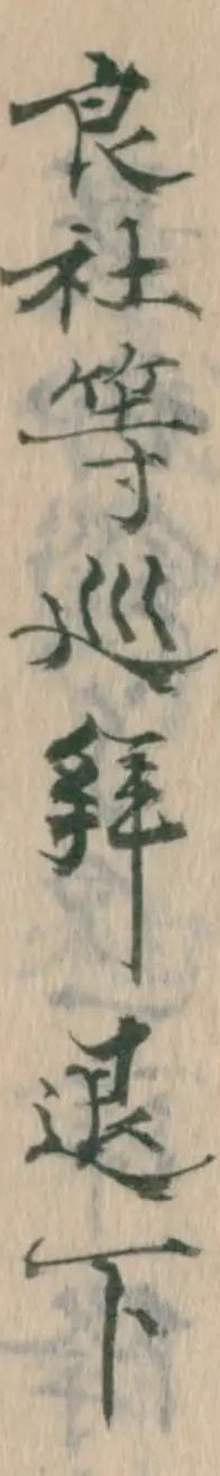良社等巡拝退下
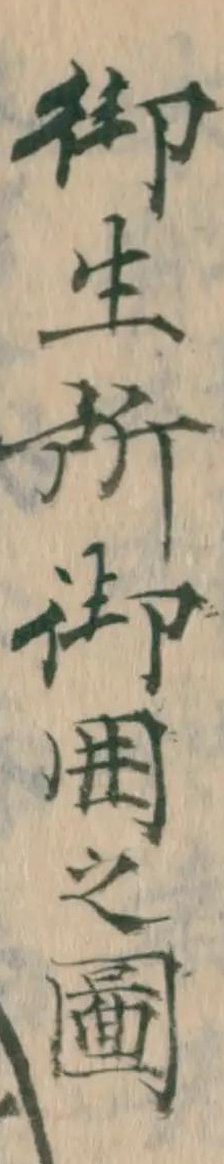御生所御囲之図
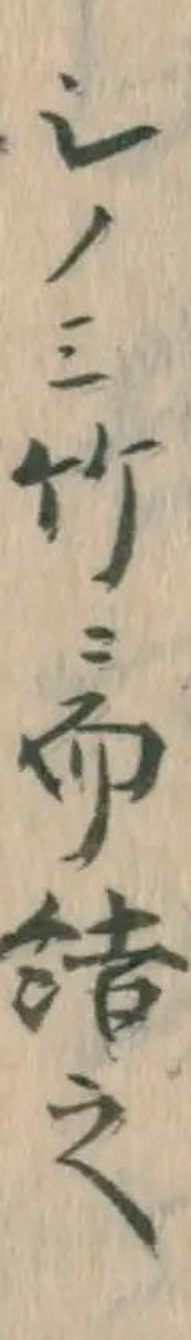シノミ竹ニ而結之

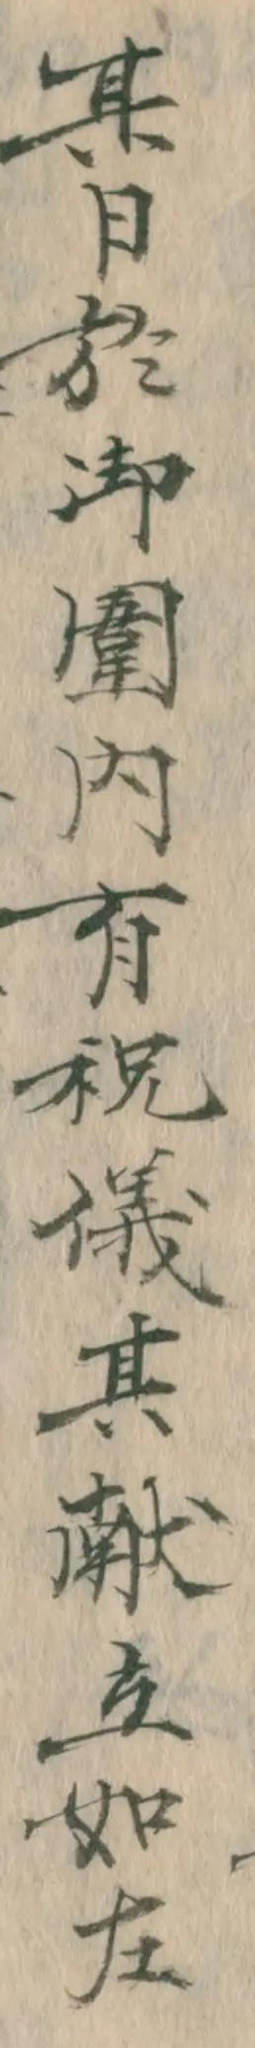其日於御囲内有祝儀其献立如左
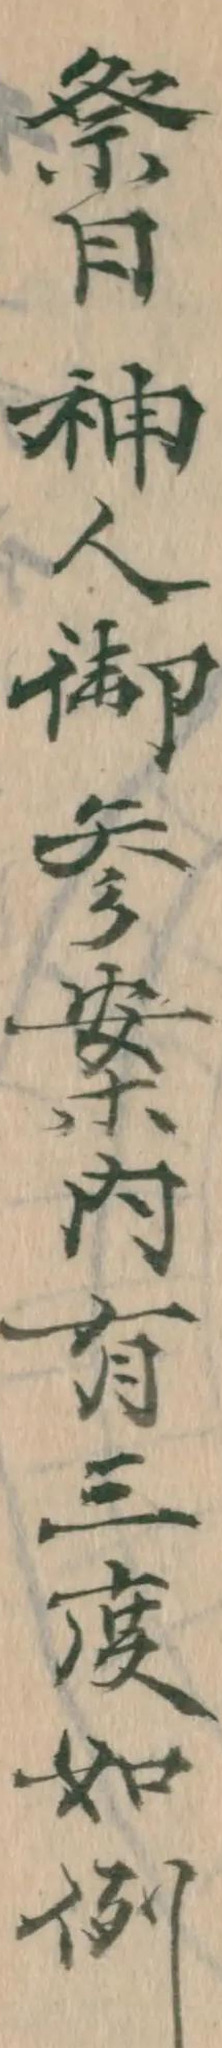祭日神人御参案内有三度如例
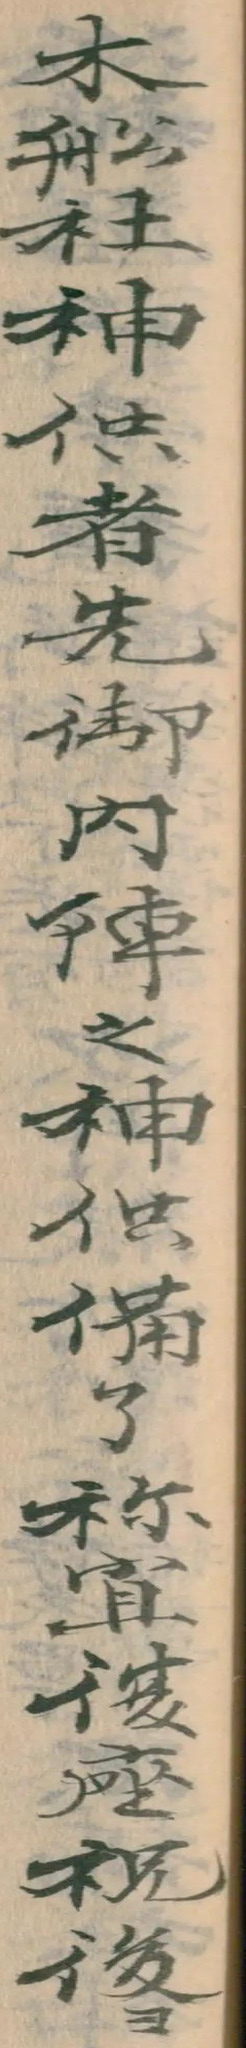木船社神供者先御内陣之神供備了祢宜復座祝後ヨ
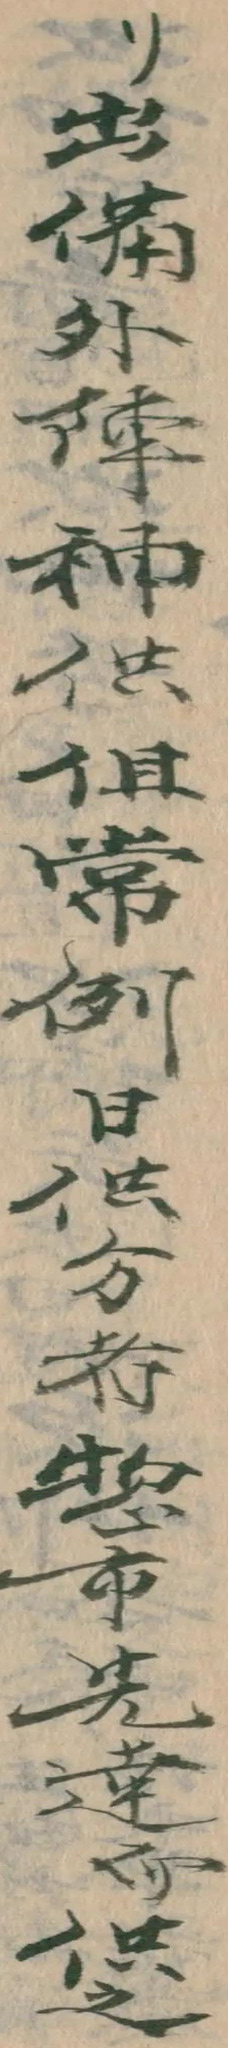リ出備外陣神供但常例日供分者惣市先達而供之
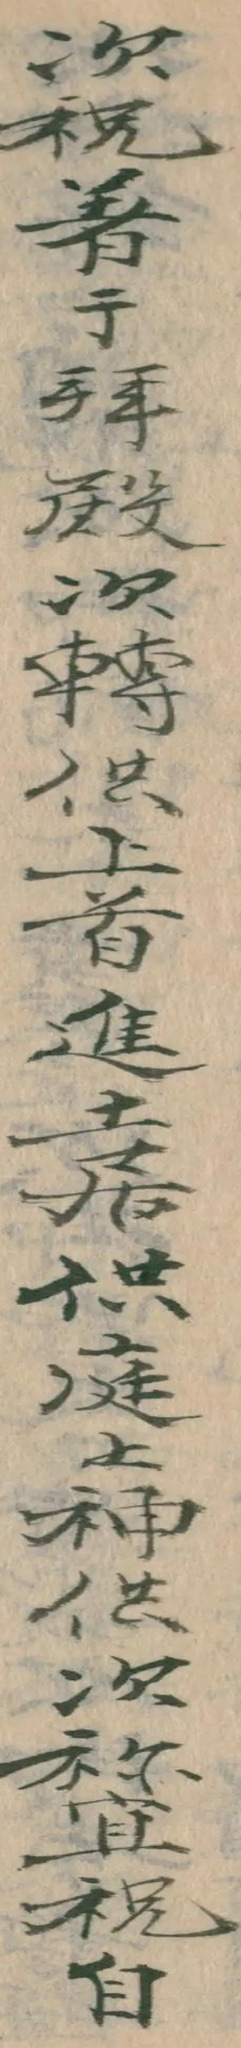次祝着于拝殿次転供上首進土居供庭上神供次祢宜祝自

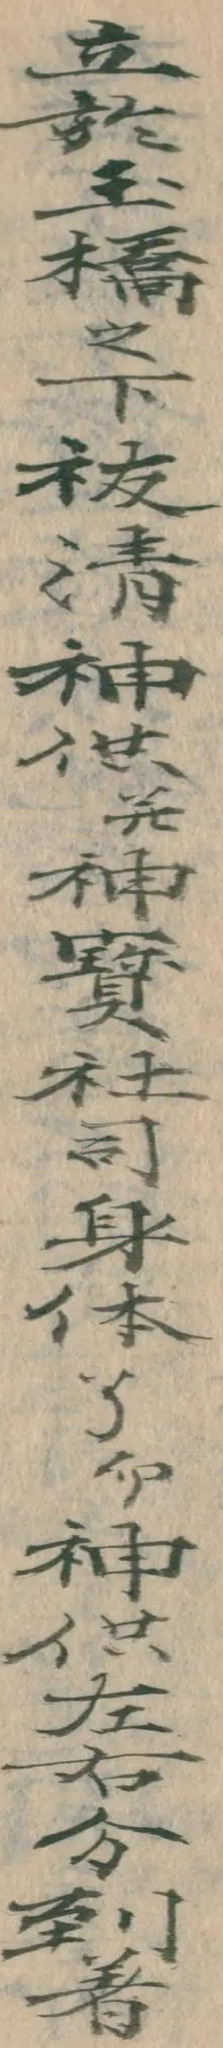立於玉橋之下祓清神供并神宝社司身体了而神供左右分到着
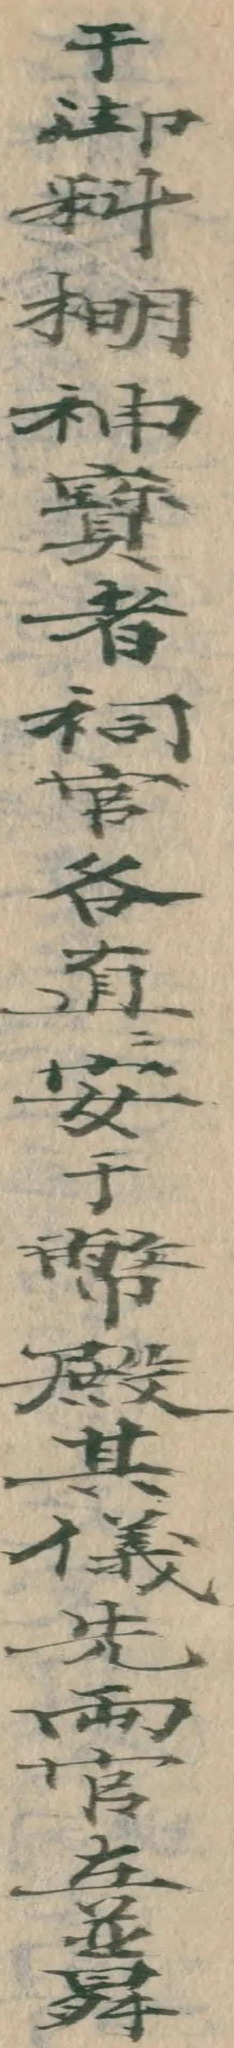于御料棚神宝者祠官各直ニ安于幣殿其儀先両官立並昇

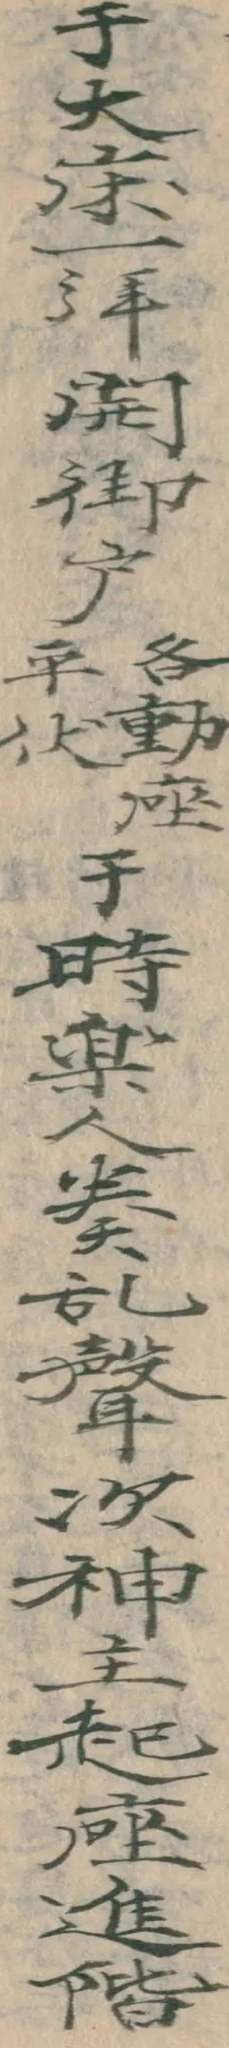于大床一拝開御戸各動座平伏于時楽人奏乱声次神主起座進階
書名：賀茂社記録. 第9冊
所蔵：国立国会図書館 National Diet Library, JAPAN
